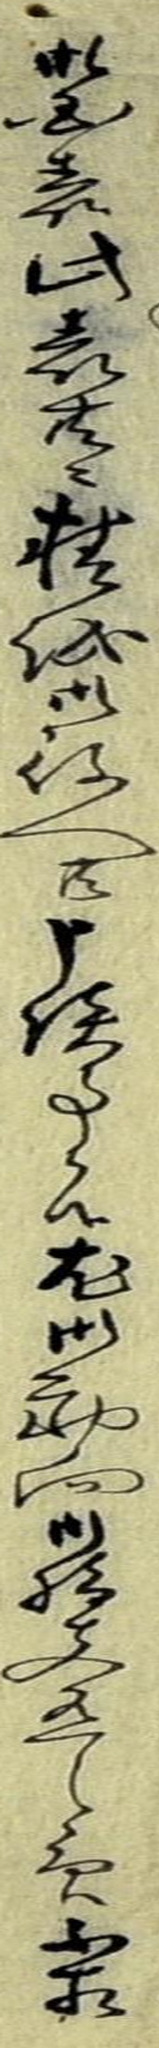御国表此表共に精誠御役人共申談事に候尤御勤向御指支有之候而は不相
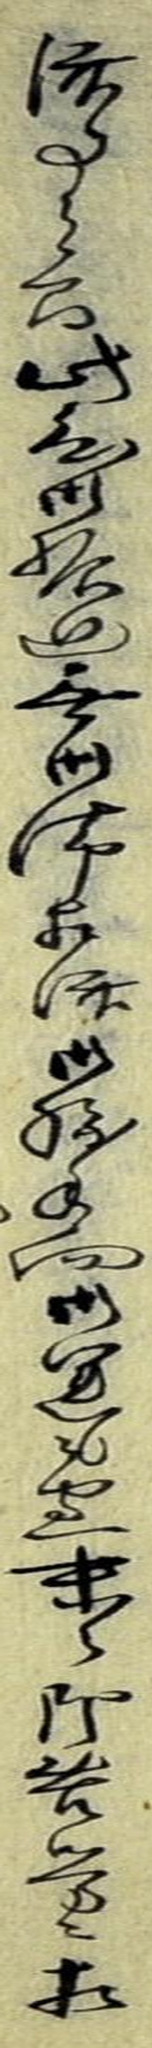済事に候間此度御振廻無御滞相済御勝手向御運も宜末々御苦労に相
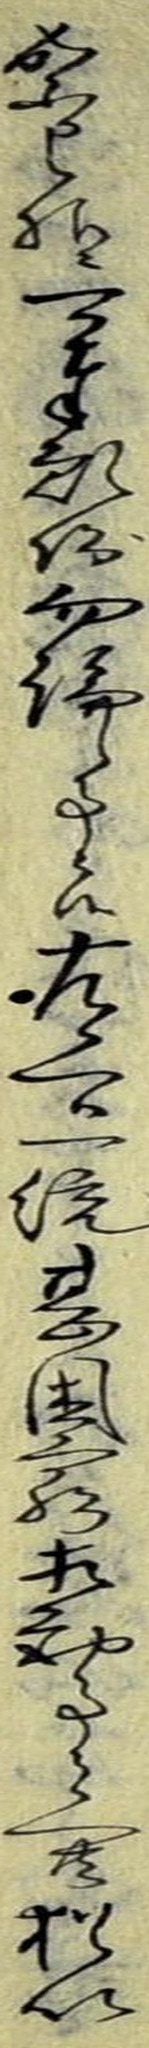成不申候様に可奉願儀勿論之事に候左候へは一統甚困窮相勤事に候へ共猶以
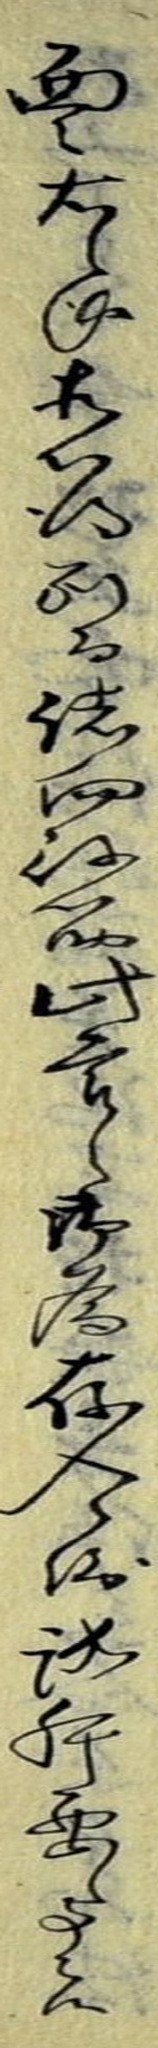面々右之趣相心得別而諸向役筋此節之御為存入候儀誠肝要之事に候

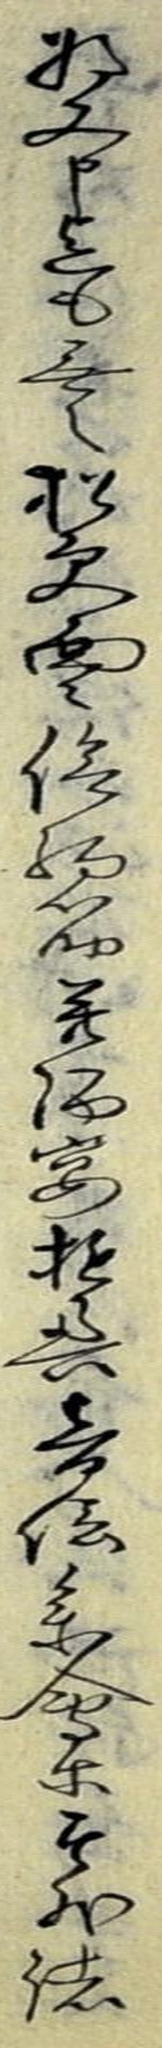将又申迄も無之猶更面々倹約筋并酒宴遊興音信参会等其外諸
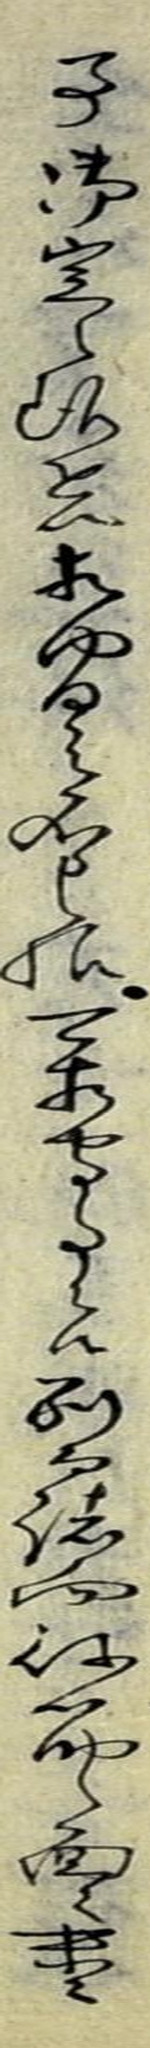事御定之趣を以相ゆるみ不申候様可相守事に候別而諸向役筋之面々末々
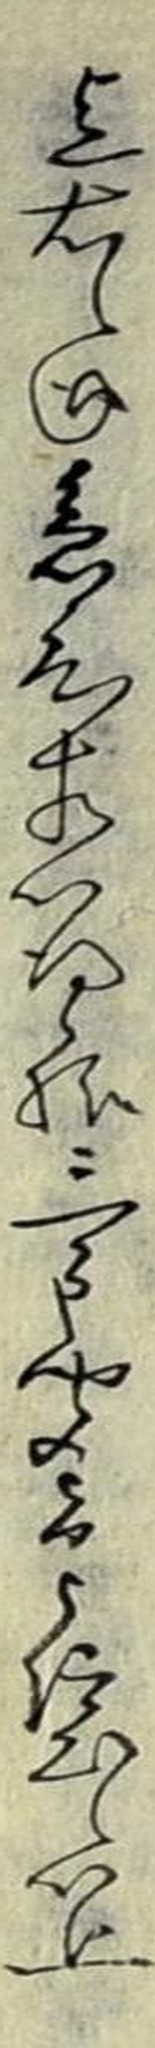迄右之趣急度相心得候様に可申聞旨被仰出候以上
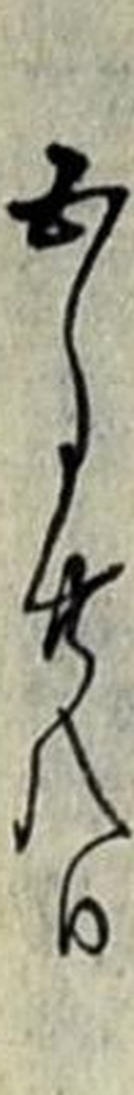五月廿八日
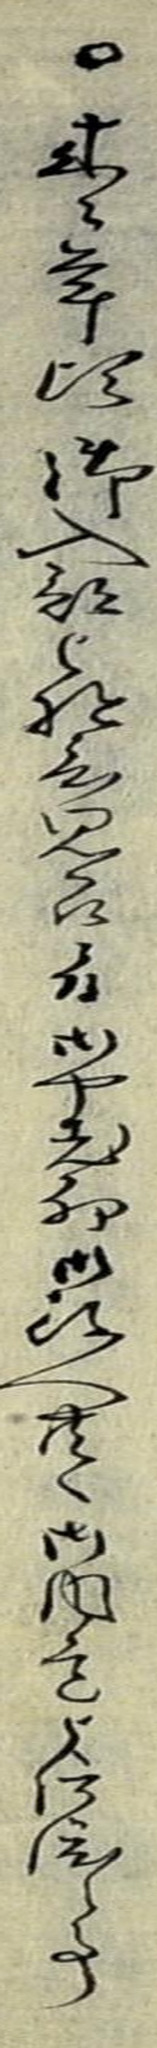〇来々年頃御入部被遊度思召に付御中老初御役人共へ御内意被仰渡候事
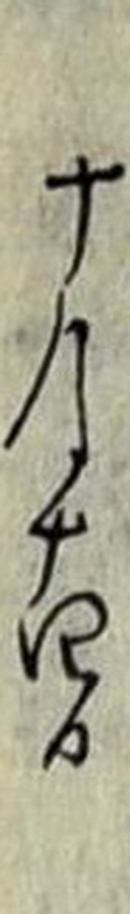十月十四日
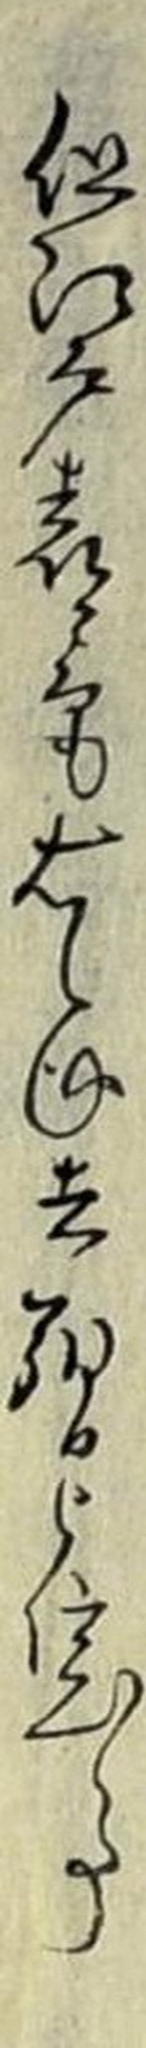但江戸表に而も右之趣去朔日被仰出候事
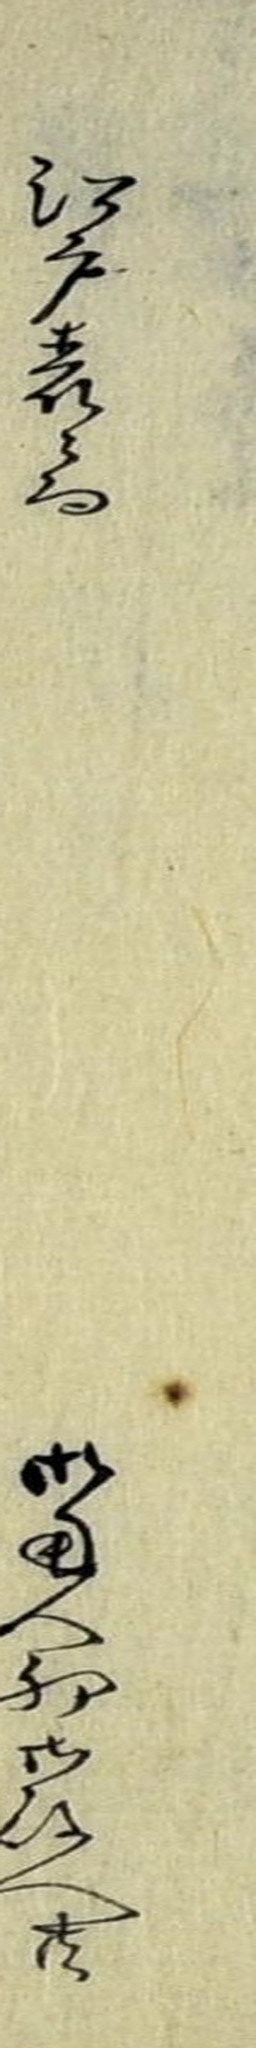江戸表に而御用人初御役人共
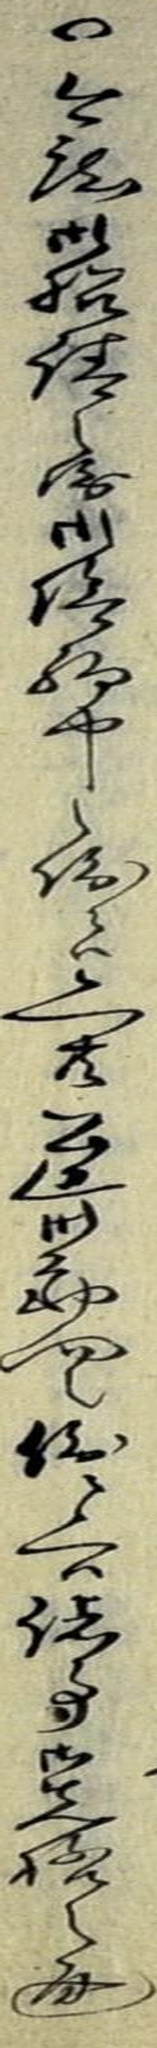〇今度御招請之儀御倹約中之儀には候へ共公辺御勤向之儀に候へは諸事御先格之通
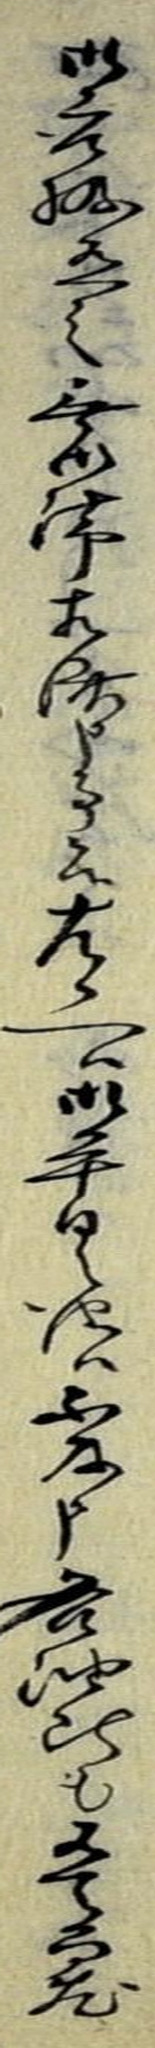御取扱有之無御滞相済申事に候左候へは御平日之儀は不及申各油断も有之間敷
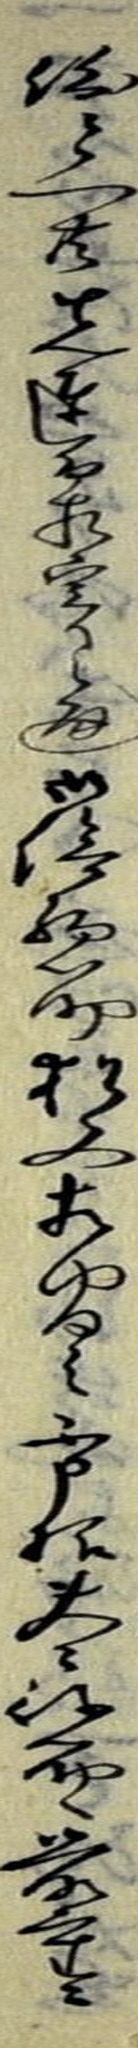儀に候へ共先達而相定り候通御倹約筋猶又相ゆるみ不申様に夫々役筋へ厳重に
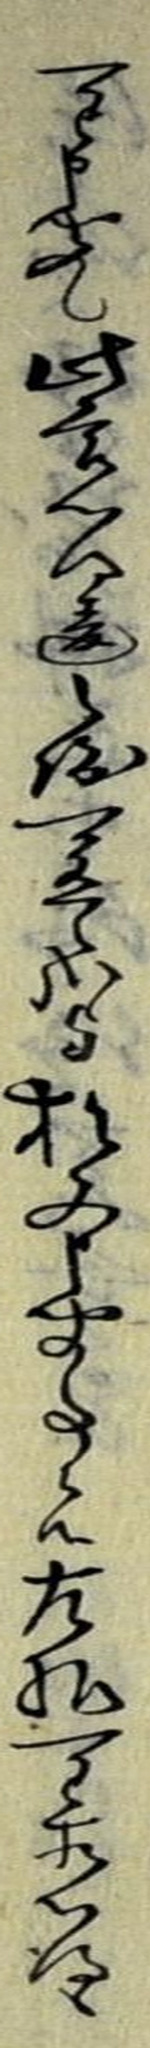可被申聞候此節心得違之儀可有之哉与度猶又申聞事に候左様可被相心得候
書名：命令之部 二
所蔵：福井県文書館 Fukui Prefectural Archives
